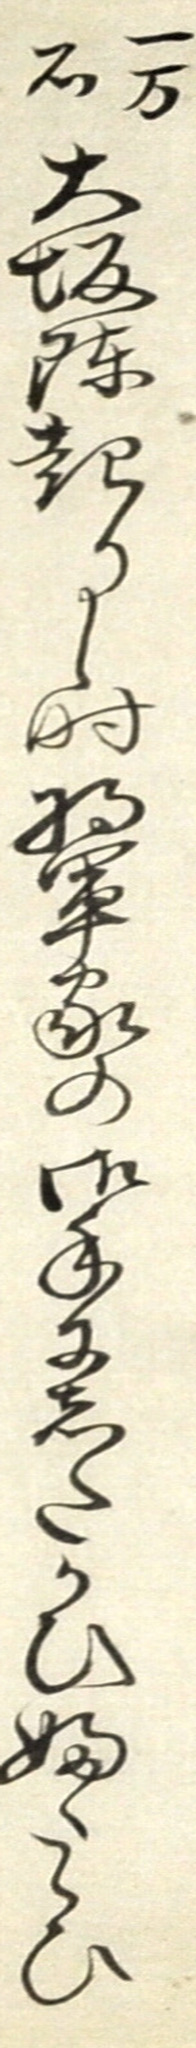一万石大坂陣起りし時将軍家の御手にしたかひふたゝひ
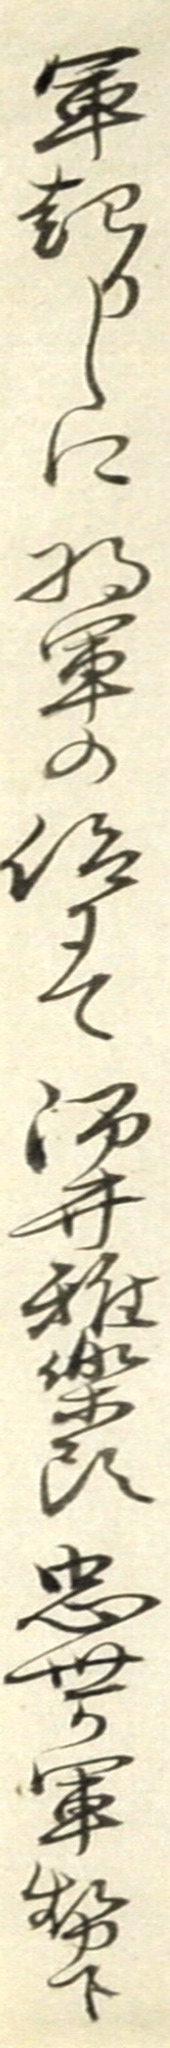軍起りしに将軍の仰にて酒井雅楽頭忠世か軍勢下
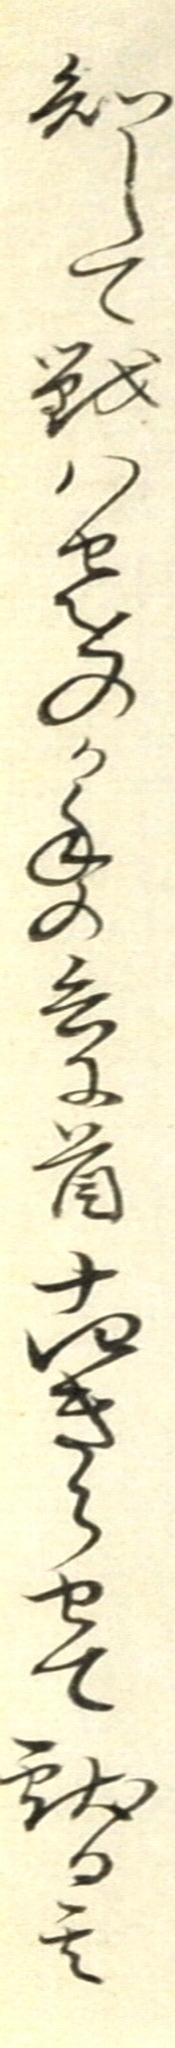知して戦はせをのか手の兵に首十四きらせて献る其

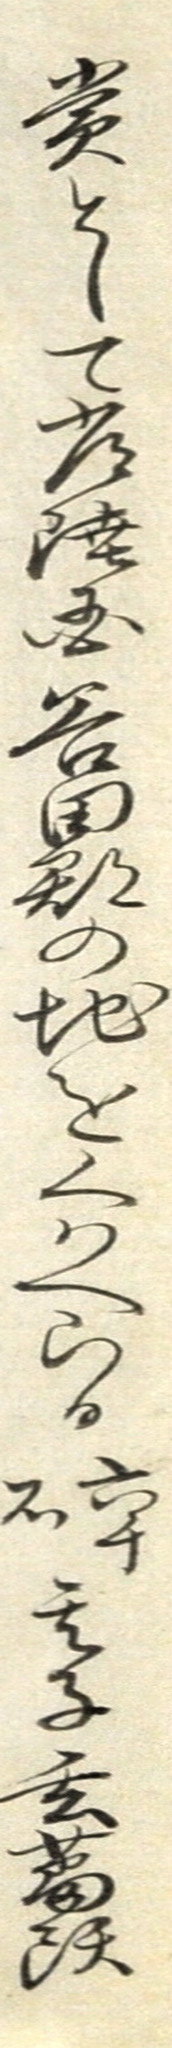賞として常陸国谷田部の地をくはへらる六千石其子玄蕃頭
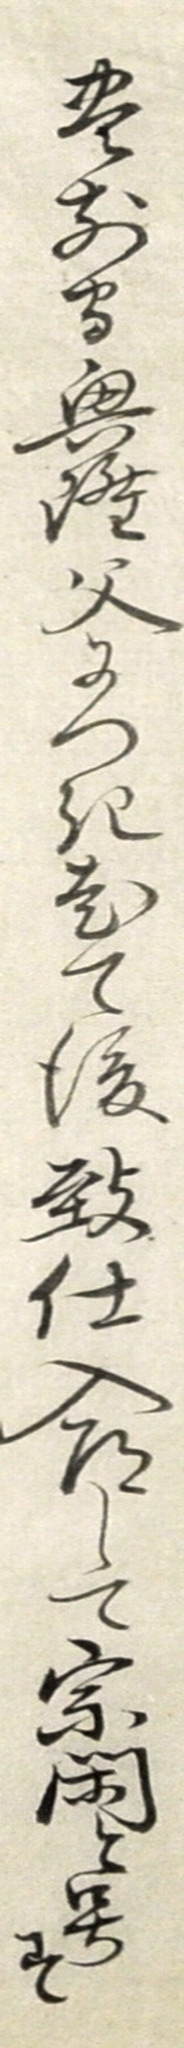豊前守興隆父につき老て後致仕入道して宗閑と号す
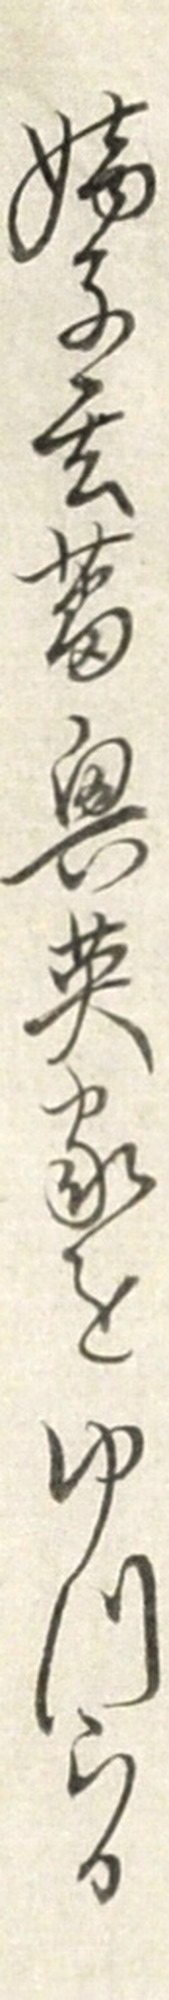嫡子玄蕃興英家をゆつらる
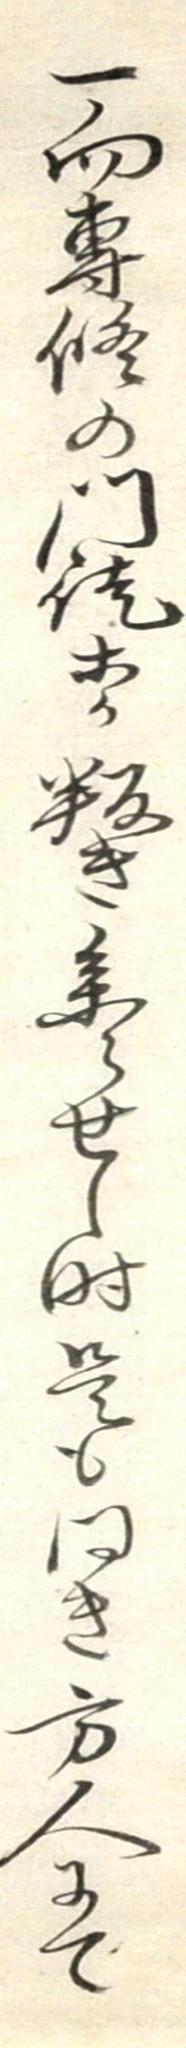一向専修の門徒等か叛き参らせし時是も同き方人にて
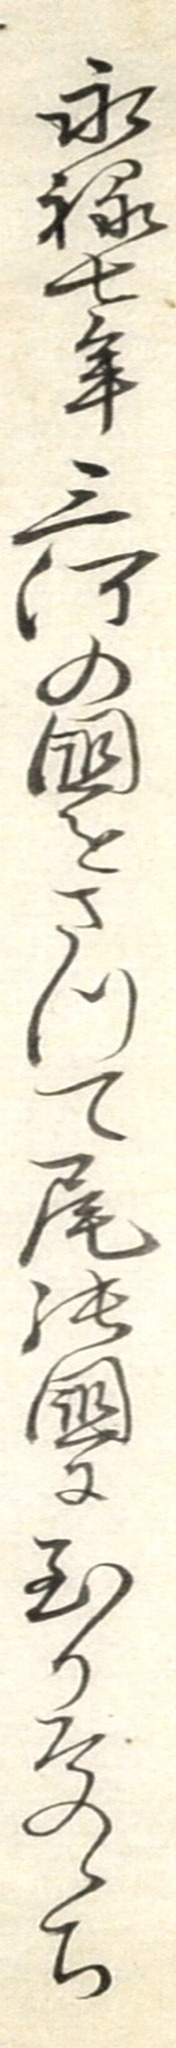永禄七年三河の国をさつて尾張国に至りそのゝち
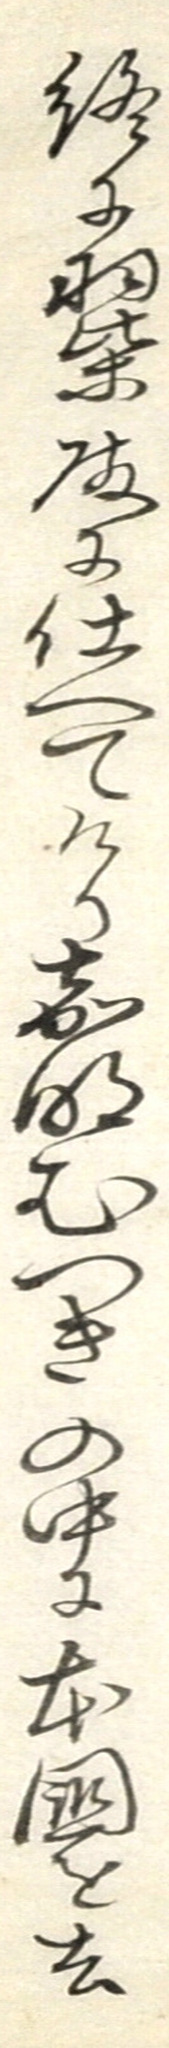終に羽柴殿に仕へてけり嘉明むつきの中に本国を去
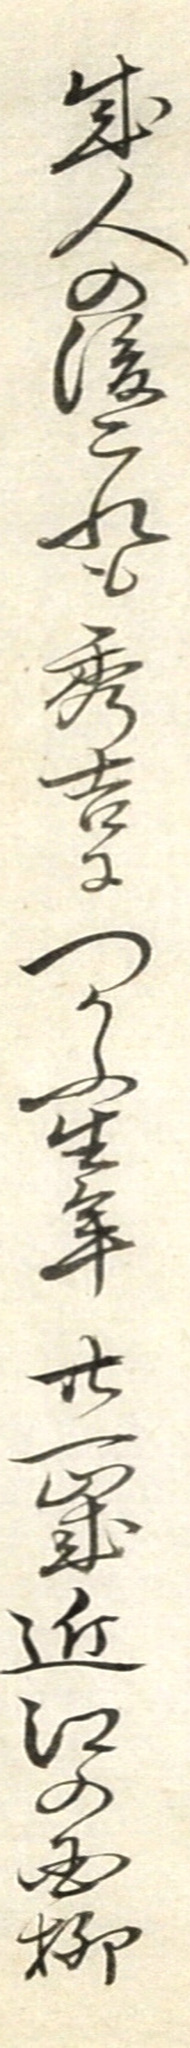成人の後これも秀吉につかふ生年廿一歳近江の国柳
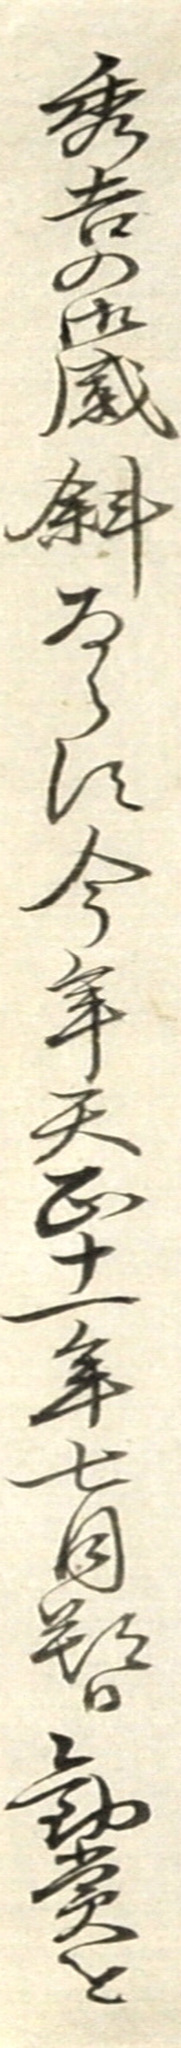秀吉の御感斜ならす今年天正十一年七月朔日勧賞を

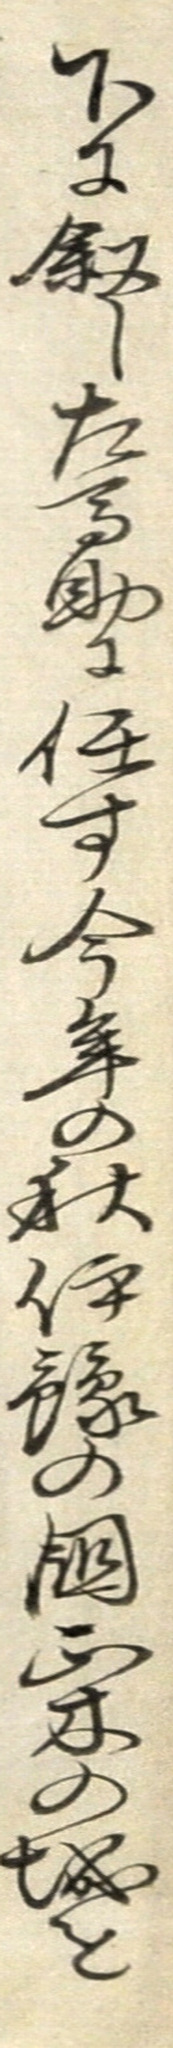下に叙し左馬助に任す今年の秋伊予の国正木の城を
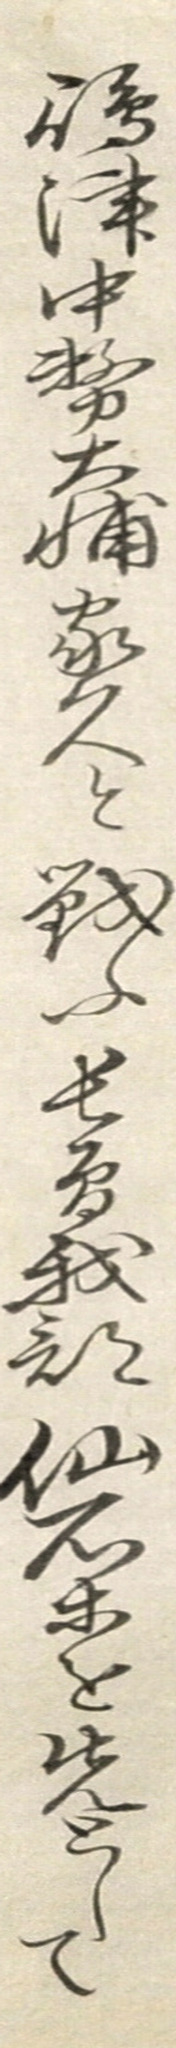島津中務大輔家久と戦ふ長曾我部仙石等を先として
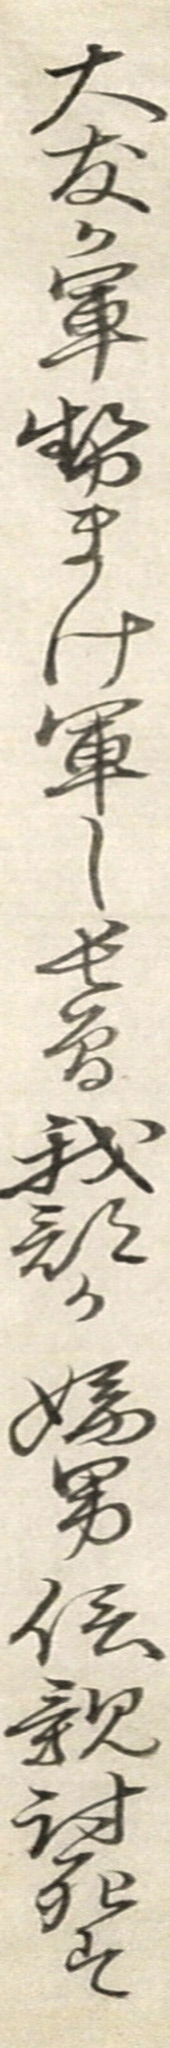大友か軍勢まけ軍し長曾我部か嫡男信親討死す
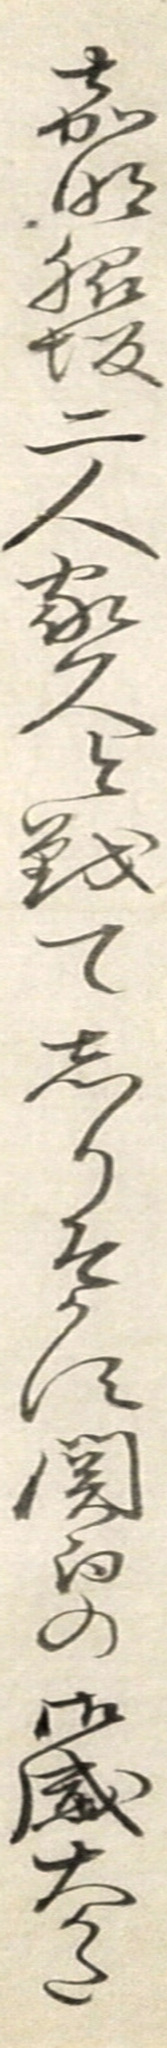嘉明脇坂二人家久と戦てしりそかす関白の御感大かた
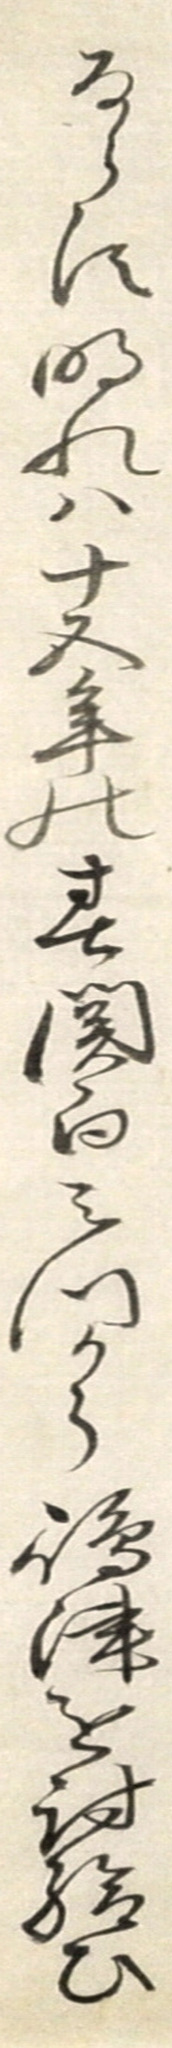ならす明れは十五年の春関白みつから島津を討給ひ
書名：藩翰譜（七・下）
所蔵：伊那市立高遠町図書館・合同会社AMANE
